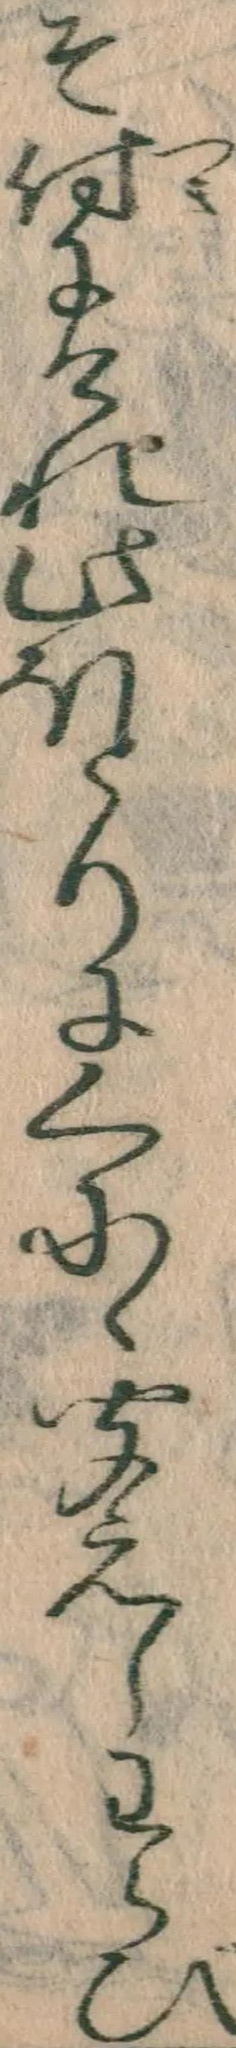そ付にけれ。此ほとりにくにゝ聞えしわらび
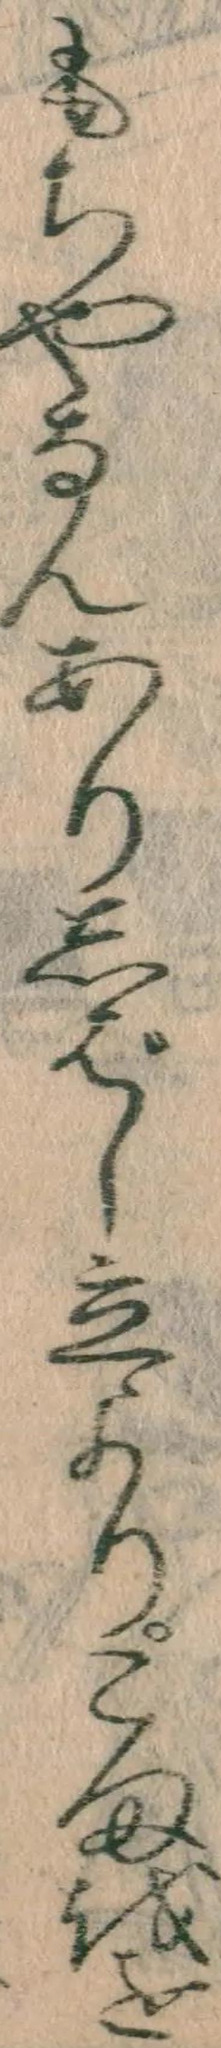もちやなんありしばし立より。こまをを
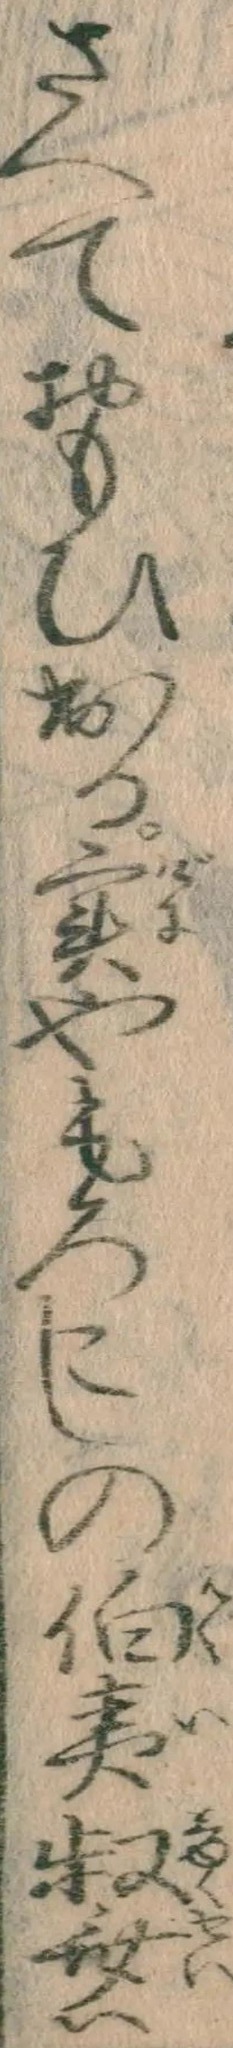さへておもひ出る実やもろこしの伯夷叔斉は
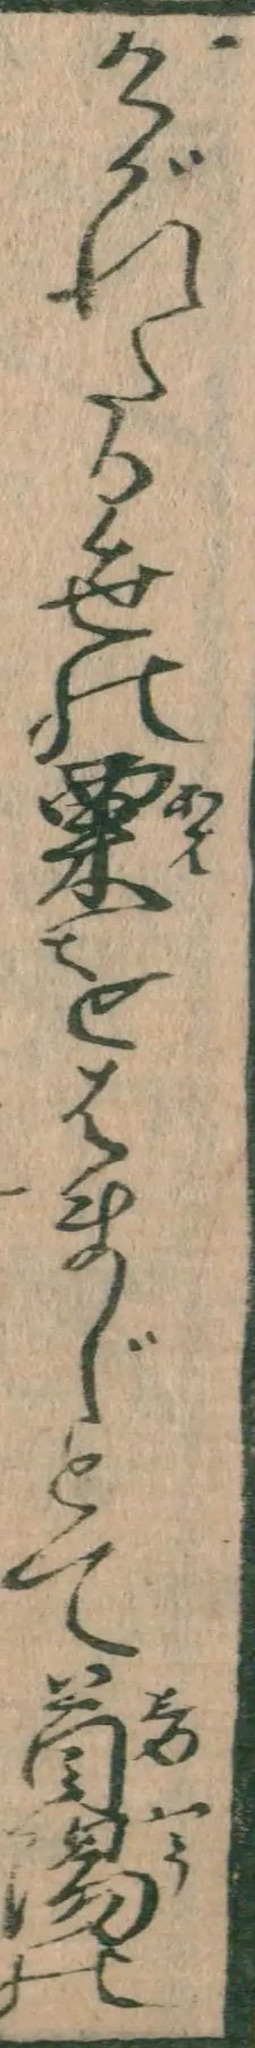けがれたる世の粟をはまじとて首陽の
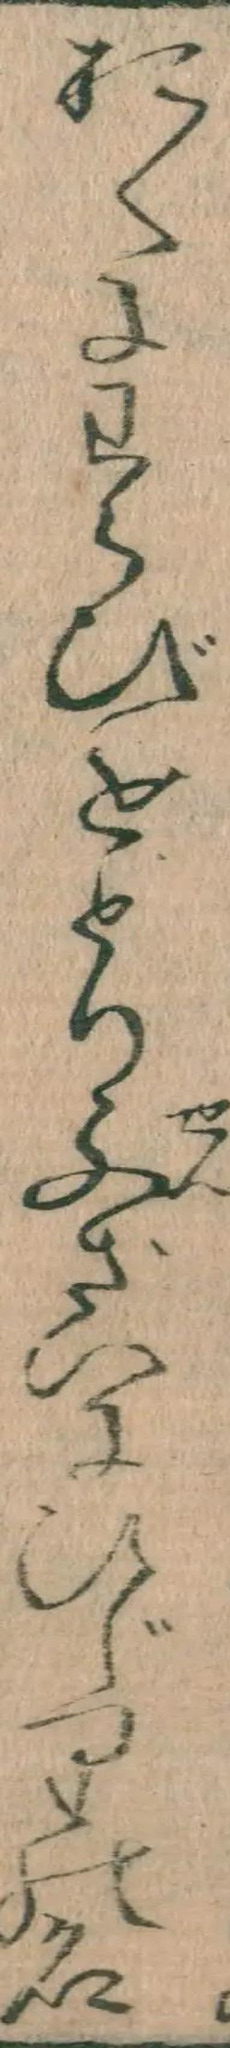おくにわらびをとり千さいにひじりの名
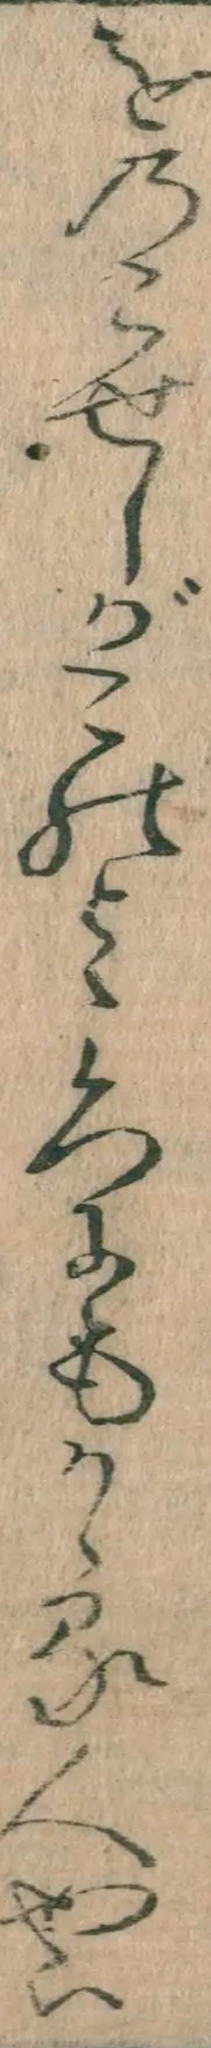をのこせしがこのところにもかゝる人やは
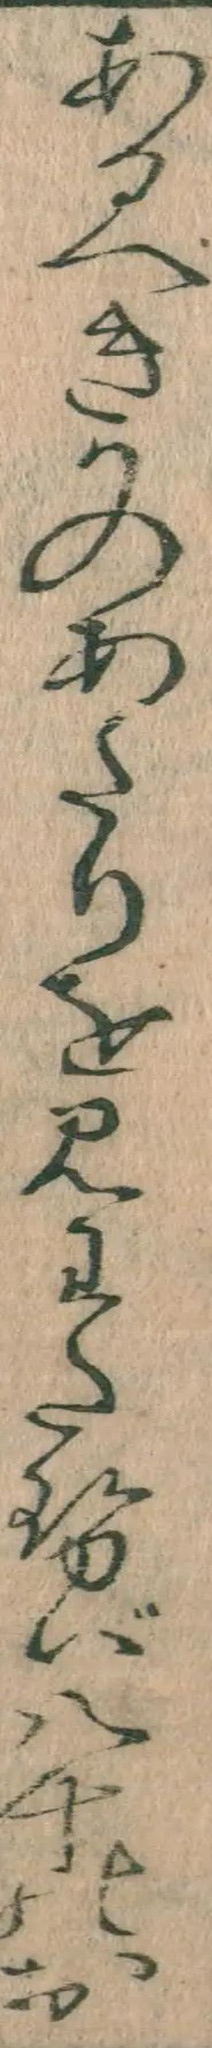あるへきかのあたりを見わたせば八十のお
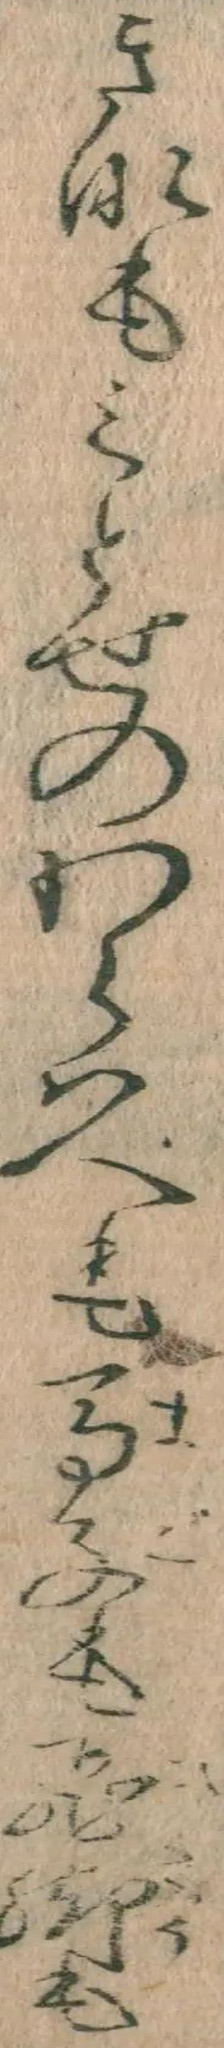きなもみとせのわらはべも馬子も飛脚も
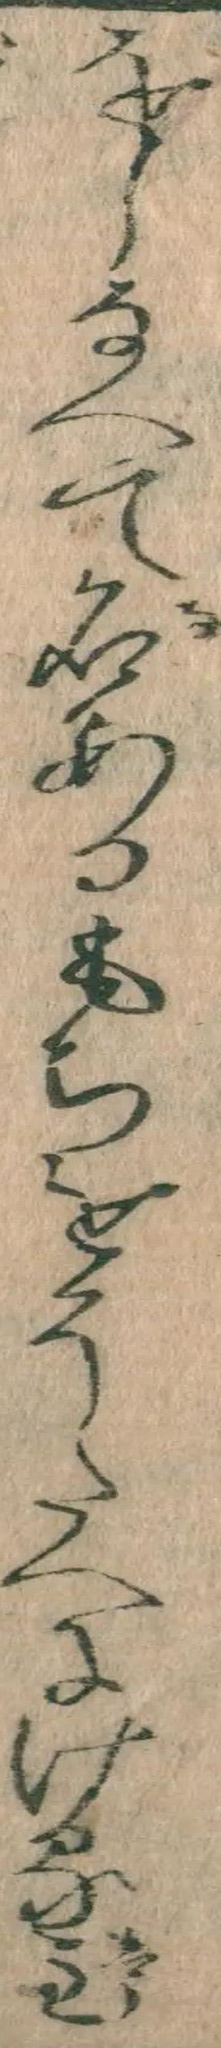をしなへて名あるもちをそたへにける主
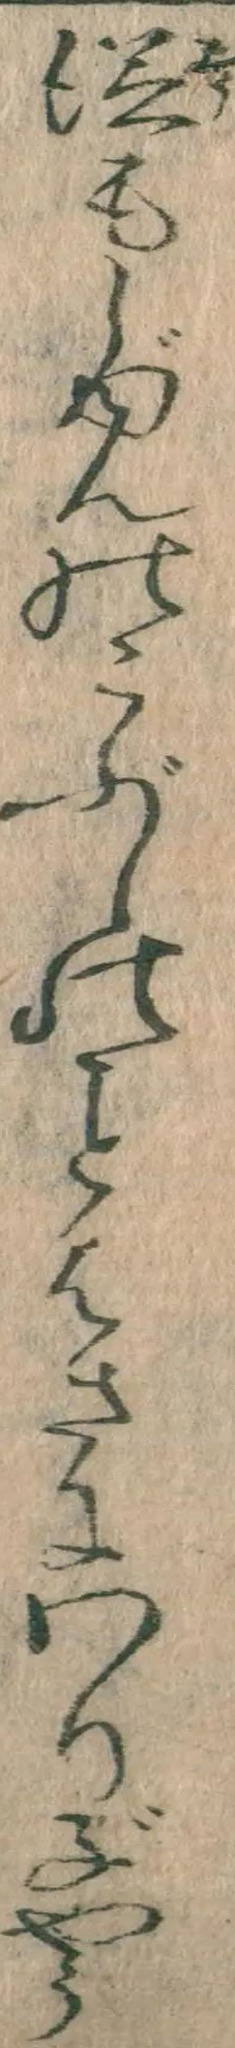従もじゆんのこぶしのことはさにわり”子やう
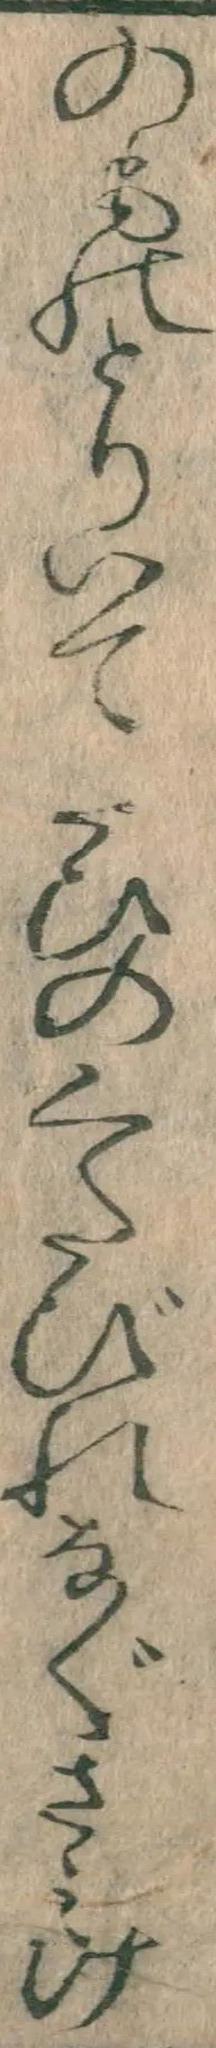のものとりいてひのくたびれなぐさみけ
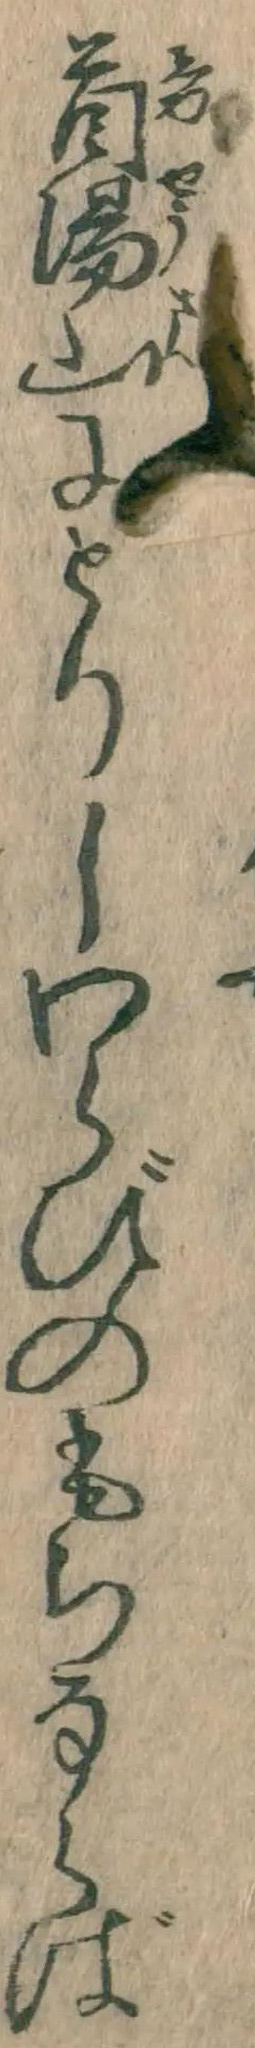首陽山にとりしわらびのもちならば

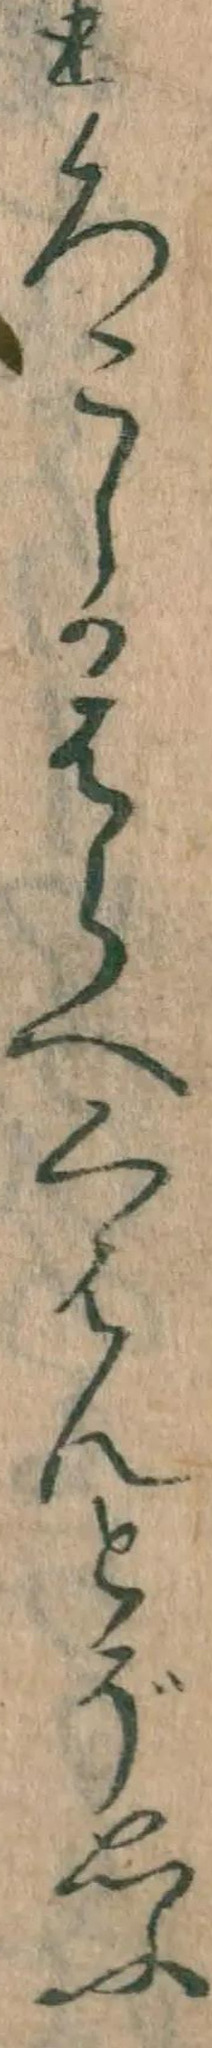もろこしかはらへくはんとぞ思ふ
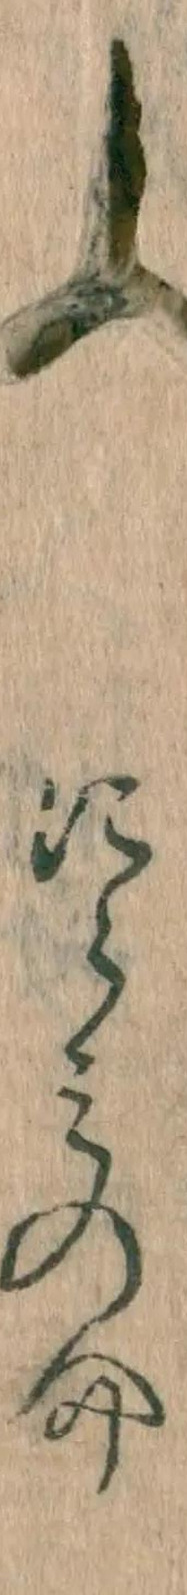にらみの介
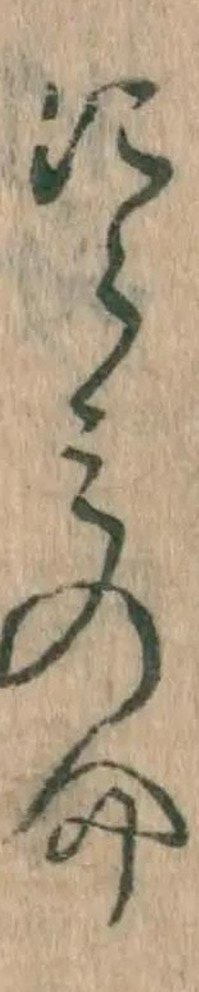にらみの介
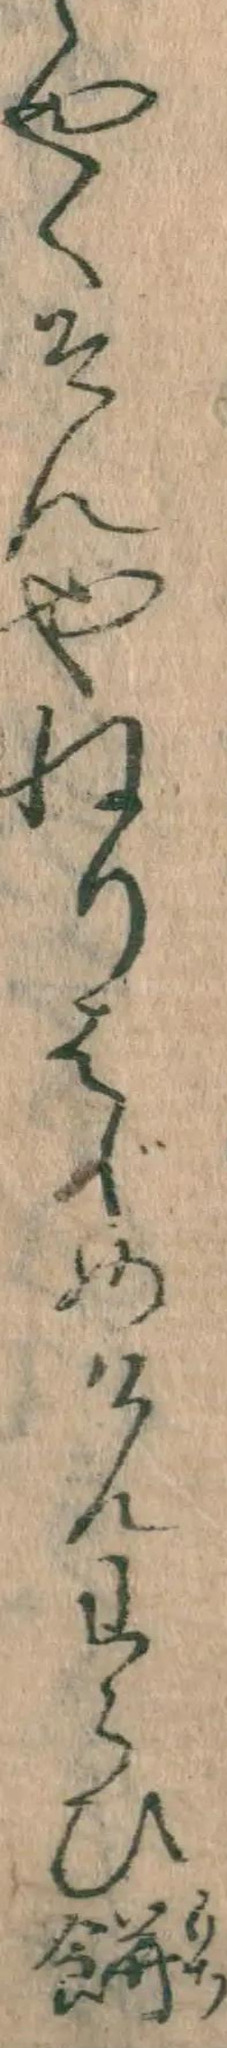しやくそんやねりはじめけんわらひ餅
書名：竹斎狂歌物語 3巻
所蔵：国立国会図書館 National Diet Library, JAPAN
